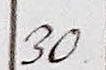30
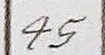45
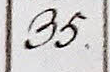35
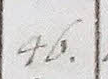46.
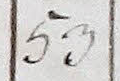53
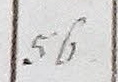56
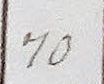70
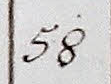58
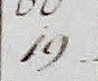19
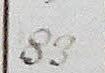83
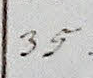35
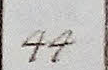44
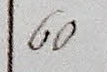60
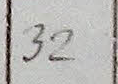32
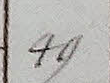49
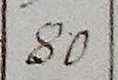80
